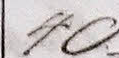40
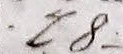28
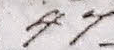47
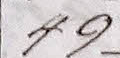49
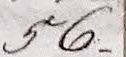56
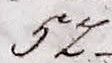52
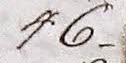46
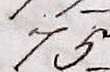75
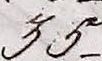35
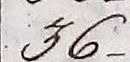36
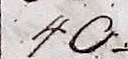40
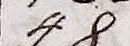48
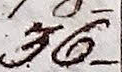36
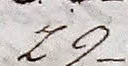29
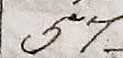57
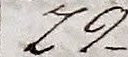29
